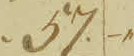57.
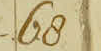68
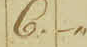6.
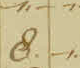8.
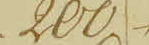200
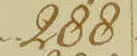288
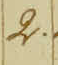2.
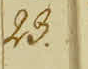23.
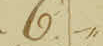6.
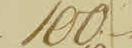100
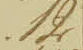12
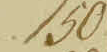150
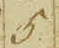5.
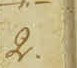2.
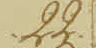22.
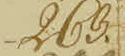263.
